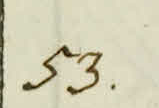53.
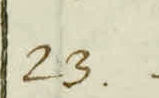23.
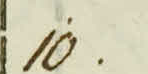10.
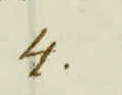4.
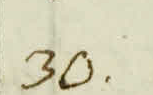30.
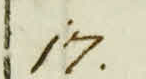17.
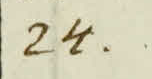24.
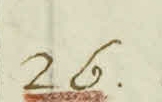26.
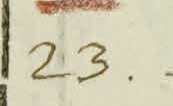23.
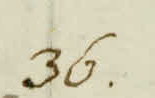36.
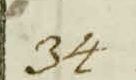34
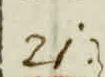21
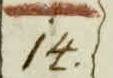14
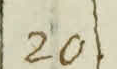20
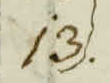13
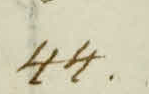44.
